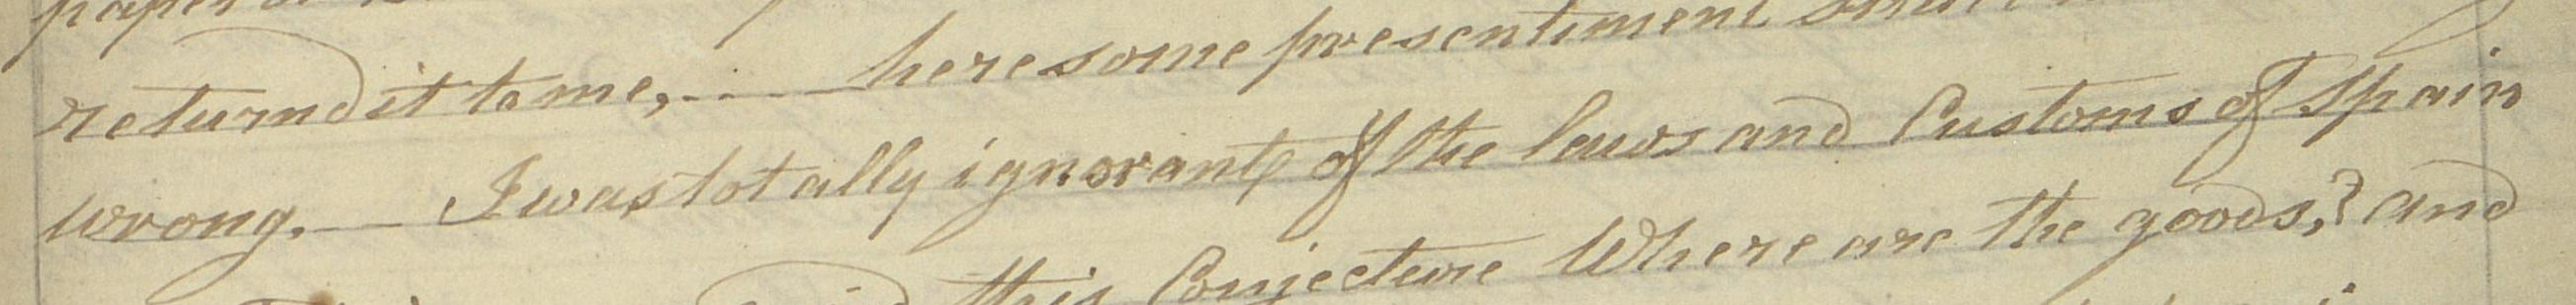wrong. I was totally ignorant of the laws and Customs of Spain
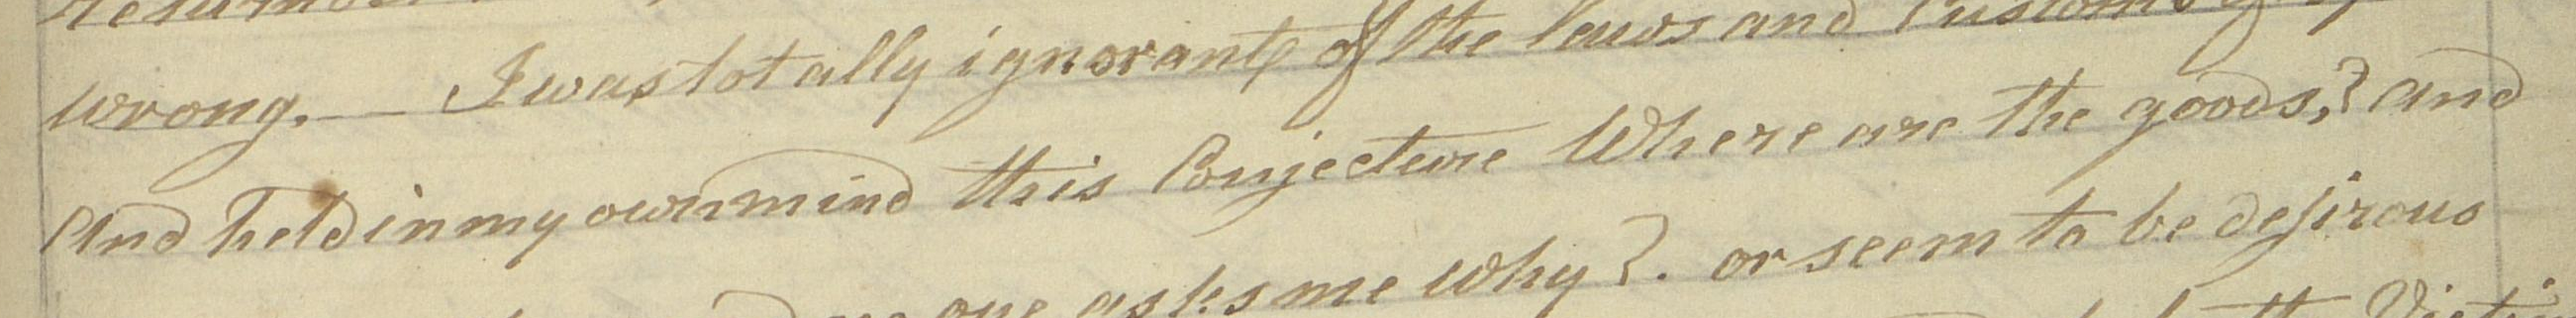And held in my own mind this Conjecture Where are the goods? and
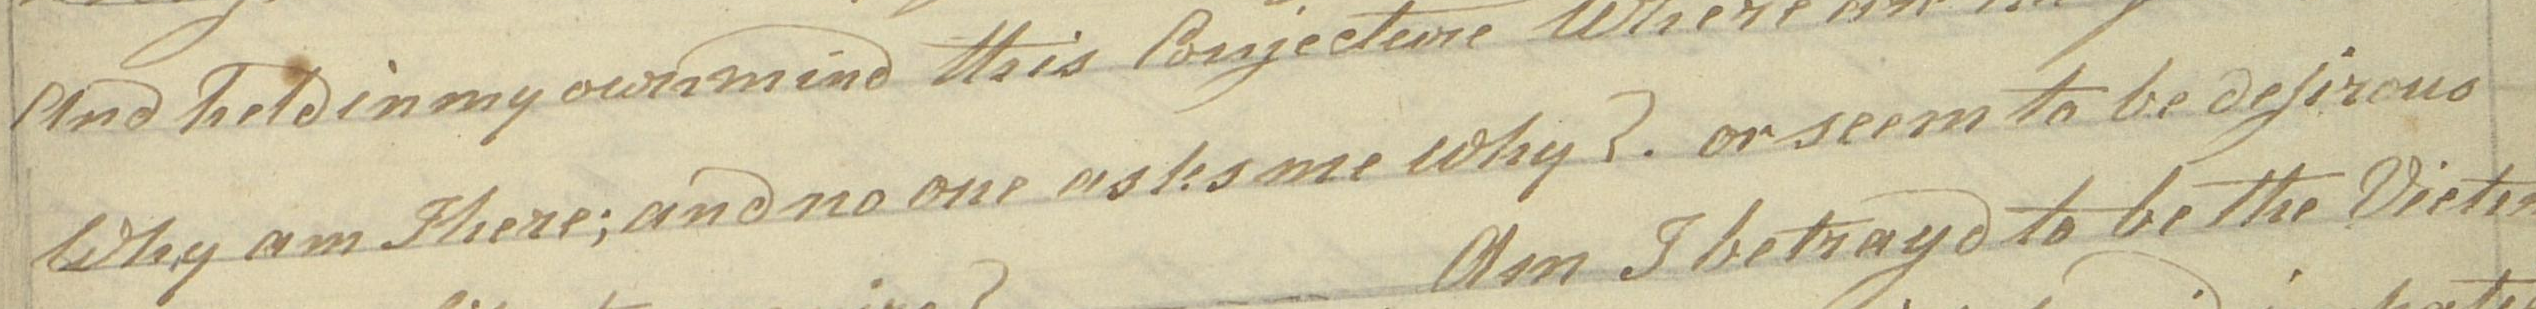Why am I here; and no one asks one Why? or seem to be desirous
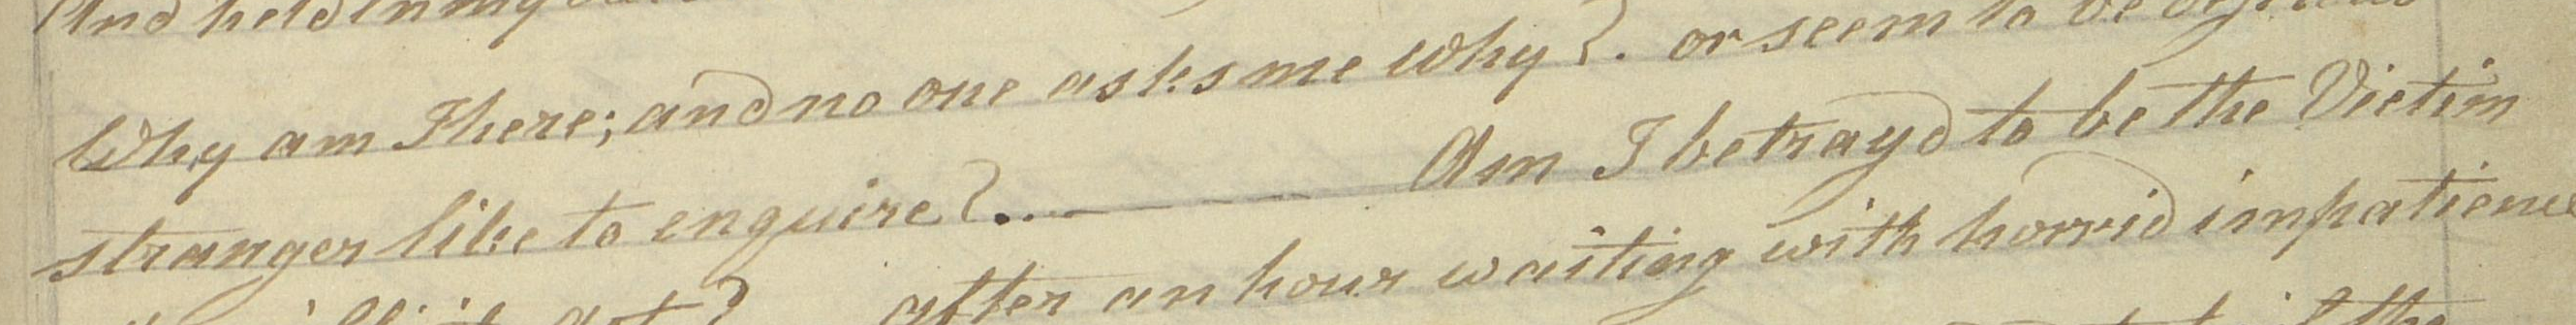stranger like to enquire? Am I betray'd to be the Victim
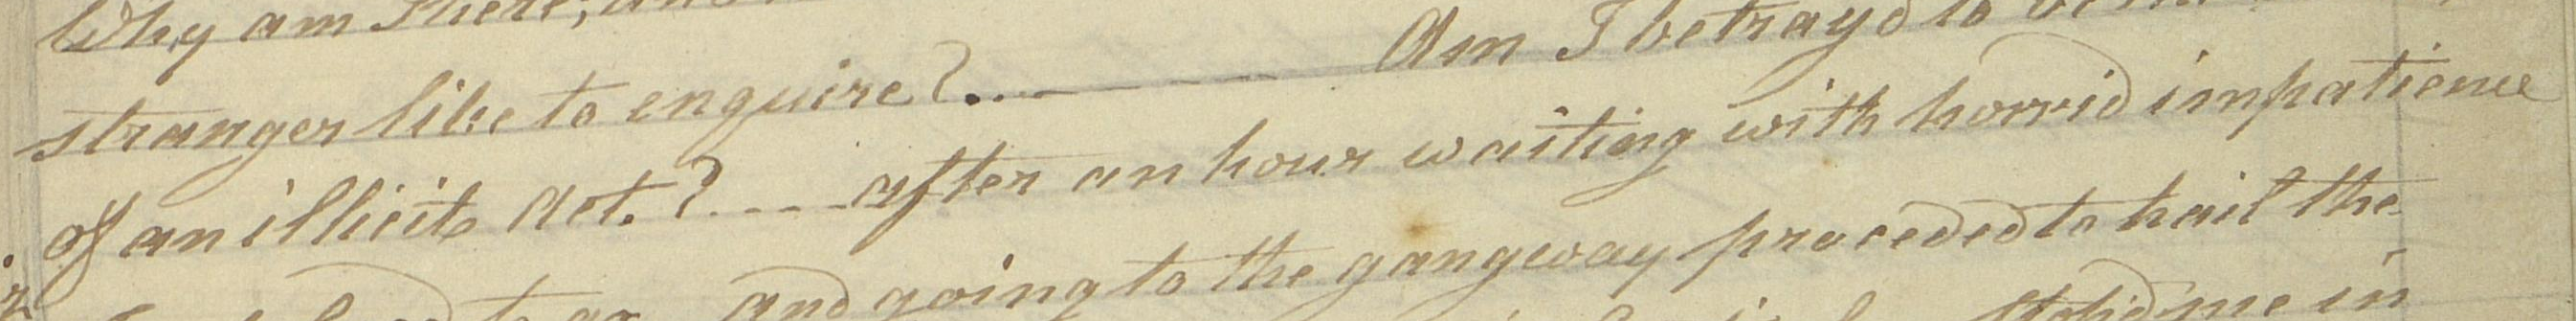of an illicit act? after an hour waiting with horrid impatience
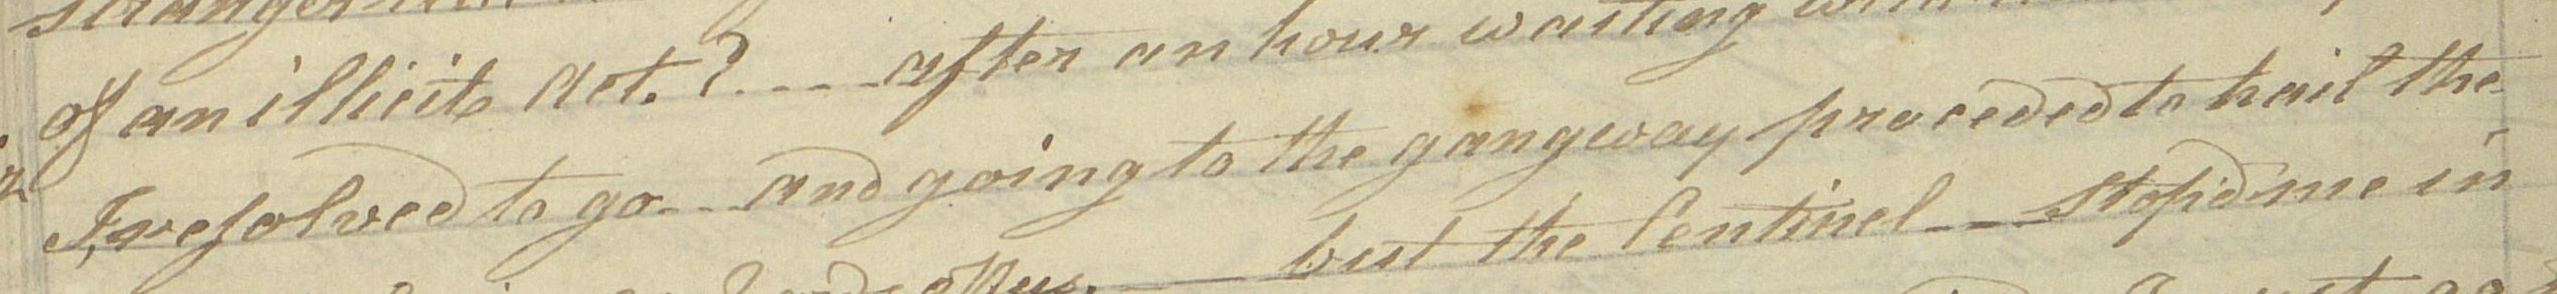I resolved to go and going to the gangway proceded to hail the
